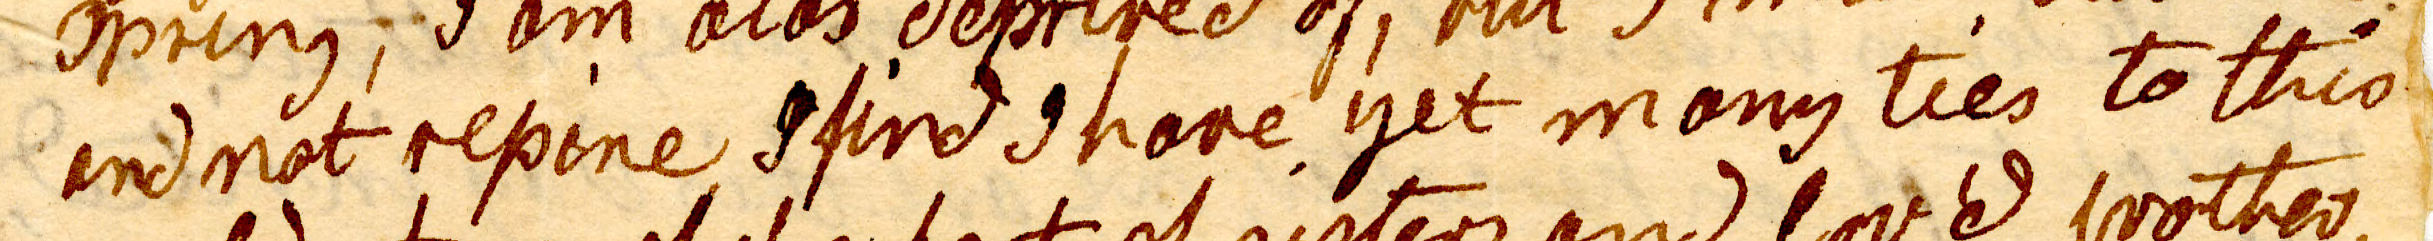and not repine I find I have yet many ties to this
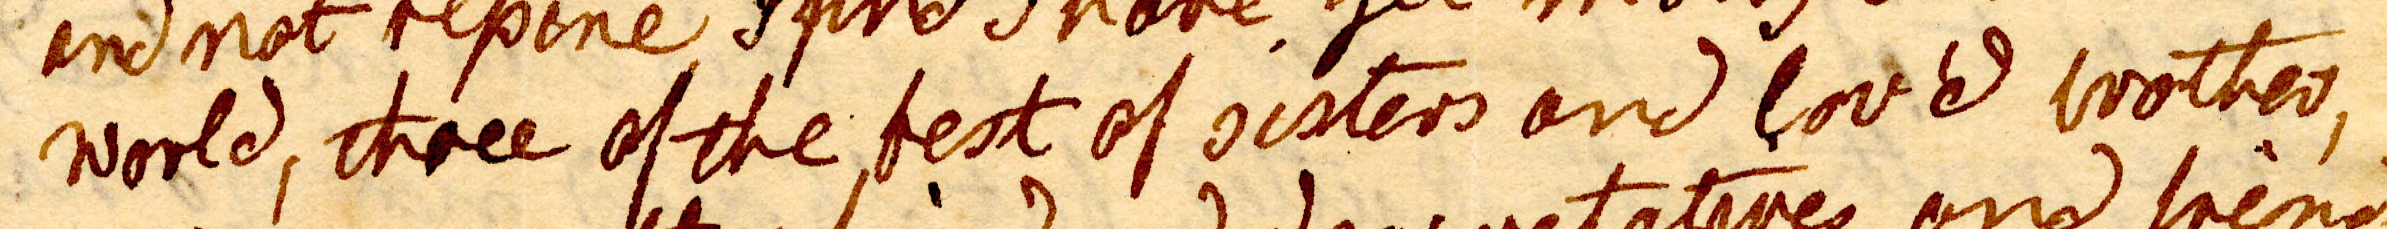world, three of the best of sisters and lov'd brother,
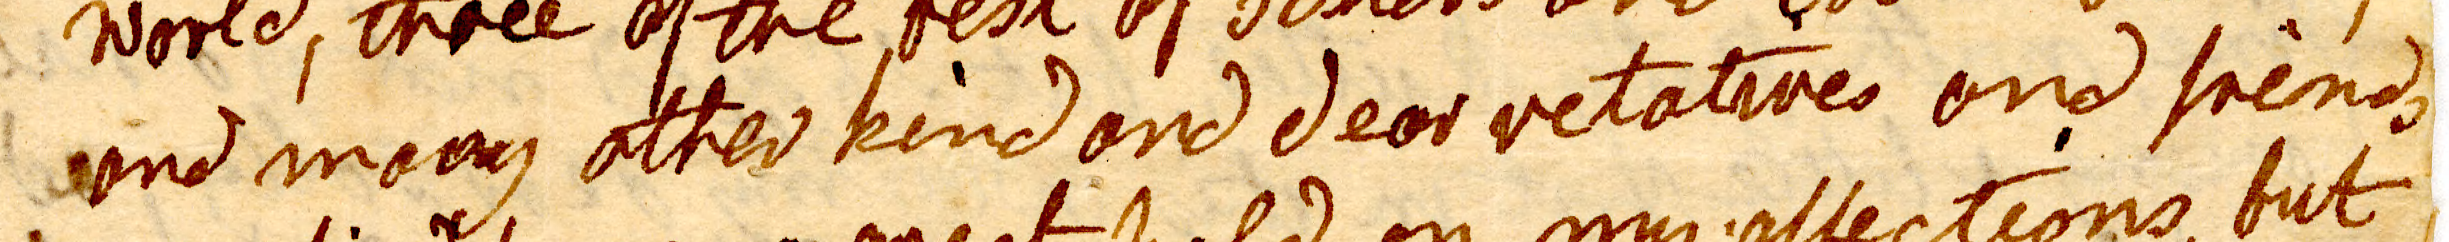and many other kind and dear retatives and friends
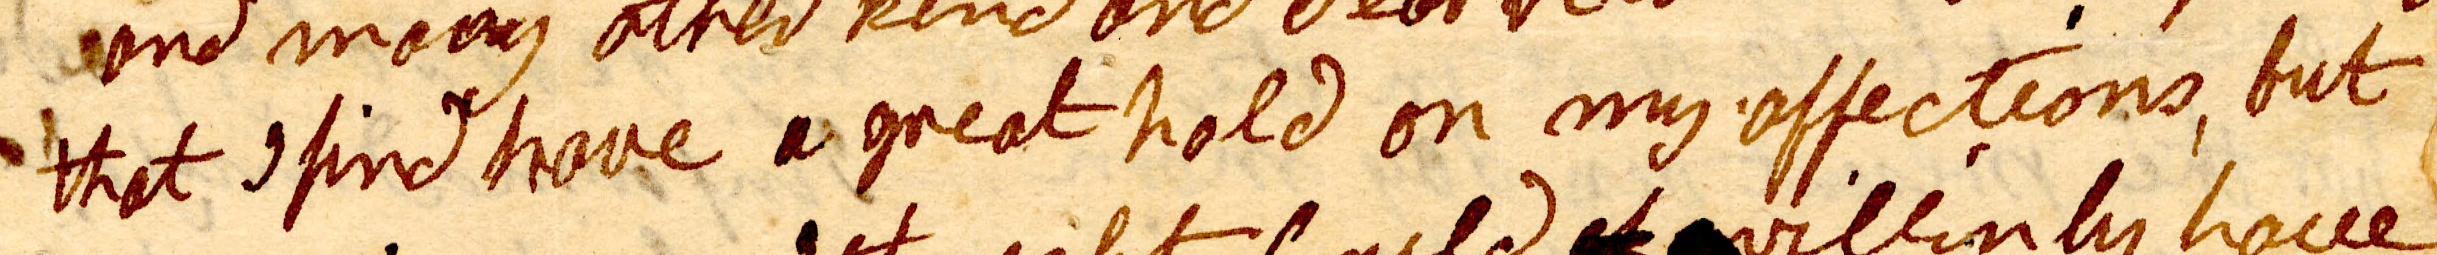that I find have a great hold on my affections, but
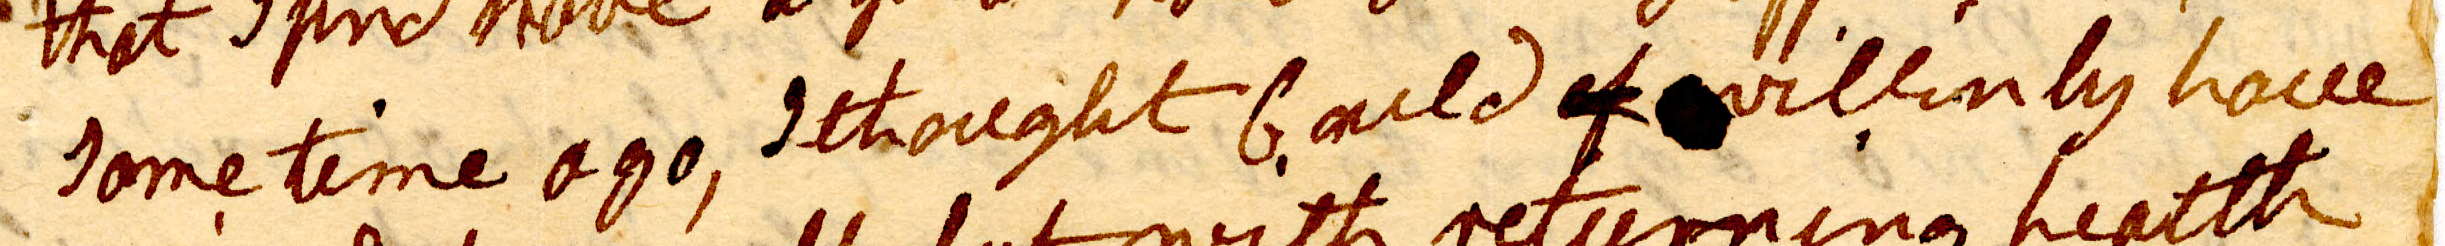sometime ago, I thought Could of willingly have
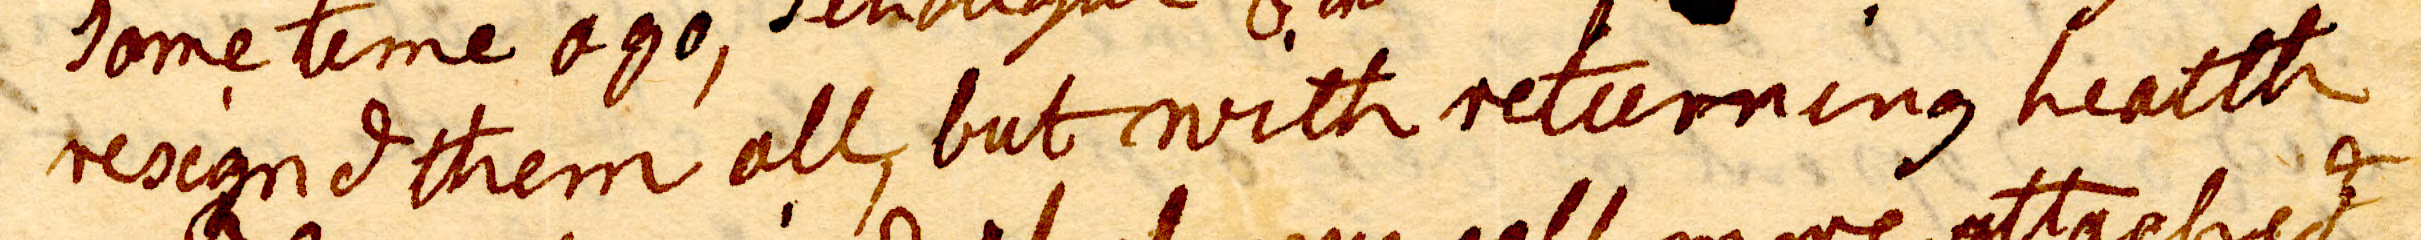resignd them all, but with returning health
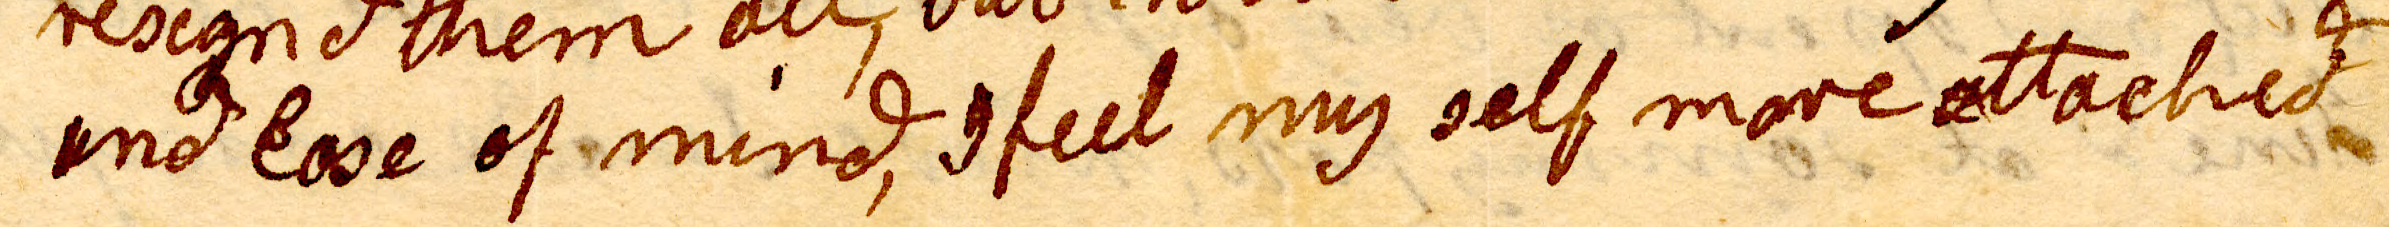and Ease of mind, I feel my self more attached
